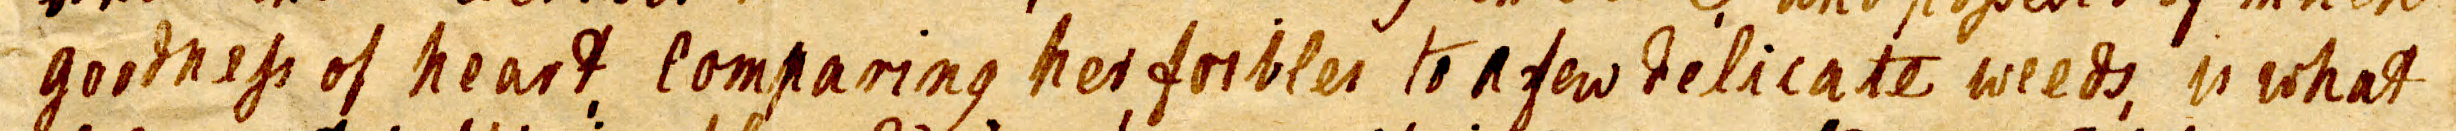goodness of heart comparing her foibles to a few delicate weeds, is what
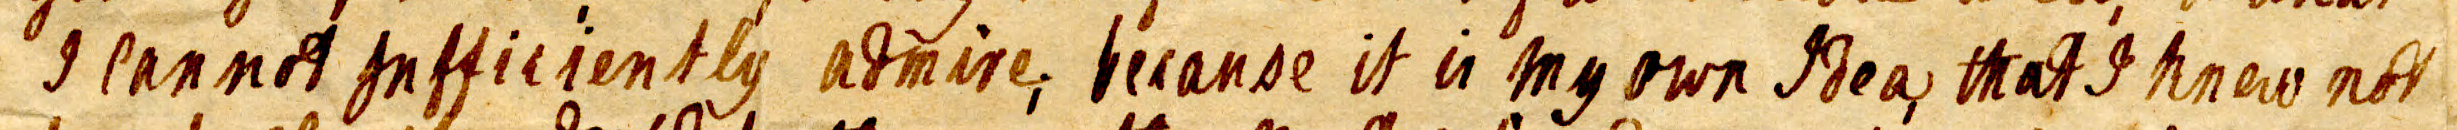I cannot sufficiently admire, because it is my own idea, that I knew not
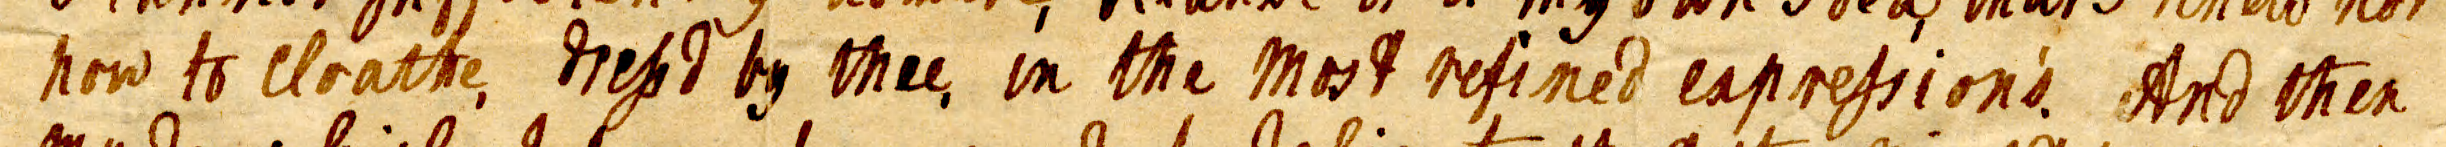how to cloathe dressd by thee in the most refined expression's. And then
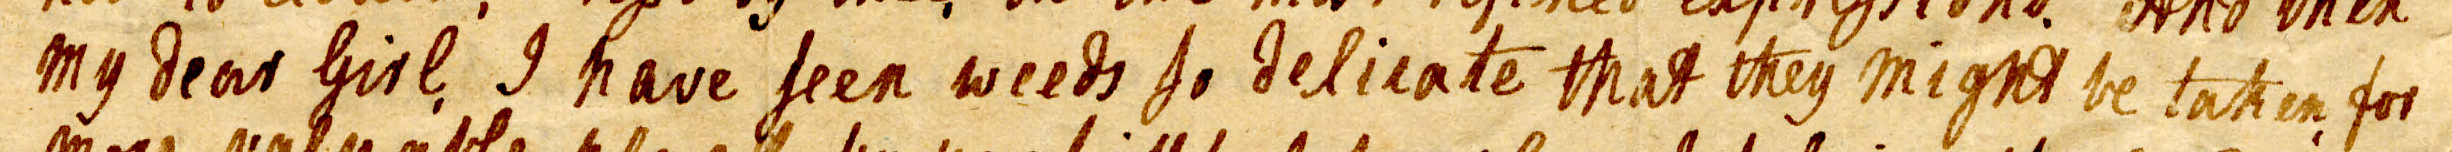my dear Girl, I have seen weeds so delicate that they might be taken for
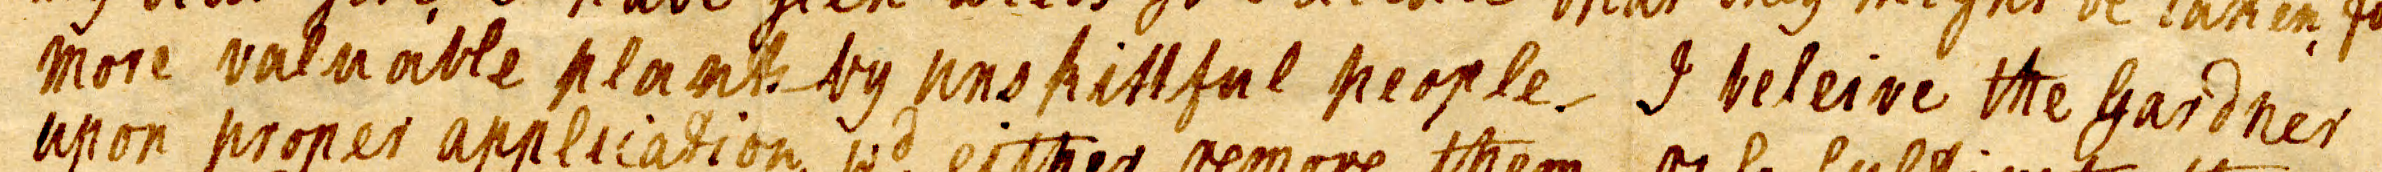more valuable plants by unskillful people. I believe the Gardner
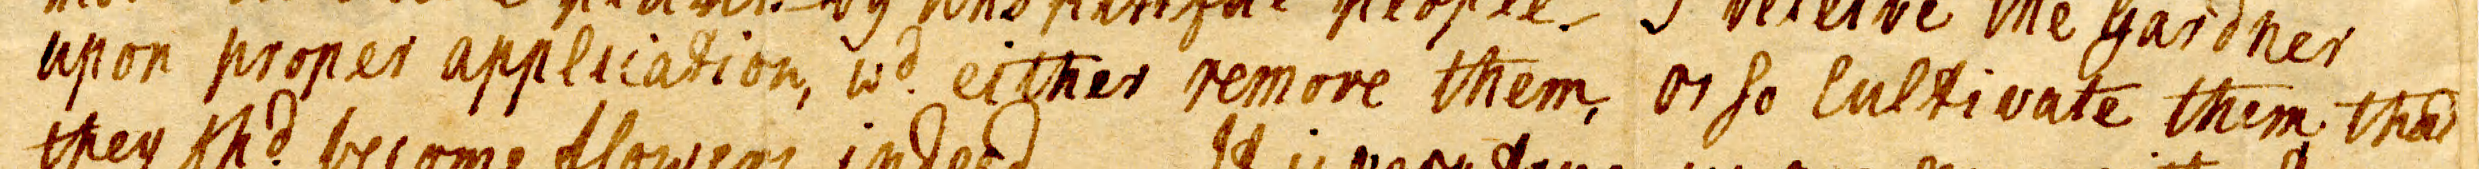upon proper application, w^d. either remove them, or so cultivate them that
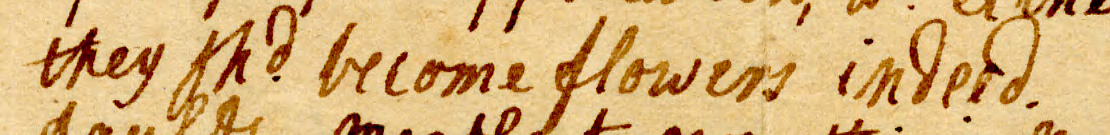they sh^d. become flowers indeed.
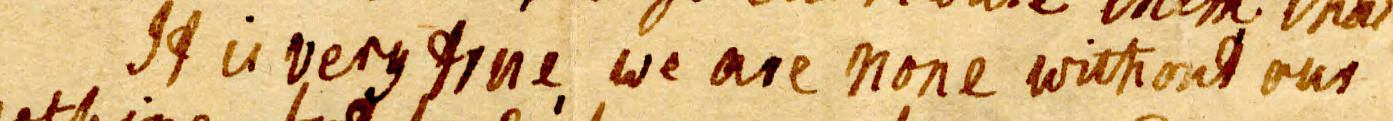It is very true, we are none without our
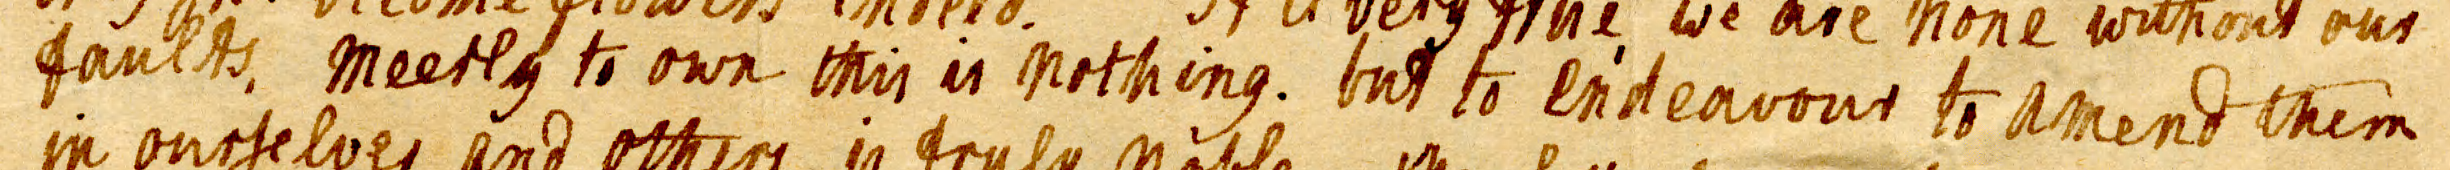faults, meerly to own this is nothing. but to endeavour to amend them
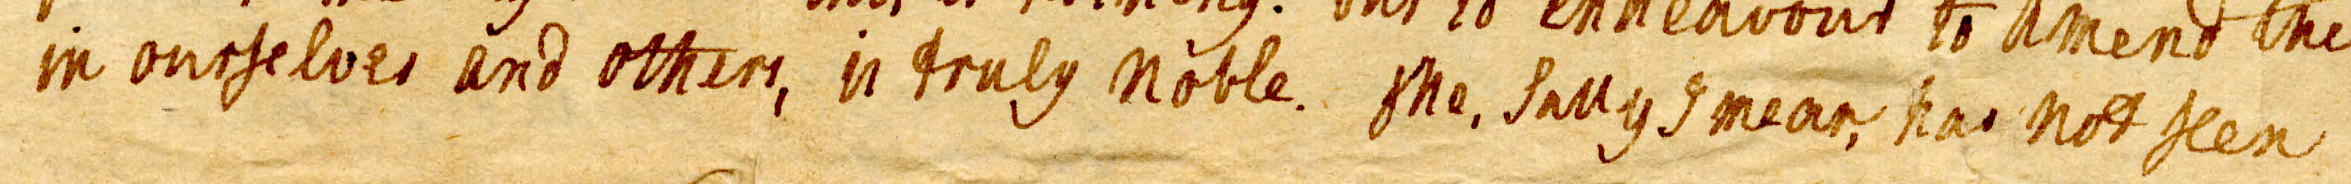in ourselves and others, is truly noble. She, Sally I mean, has not seen
